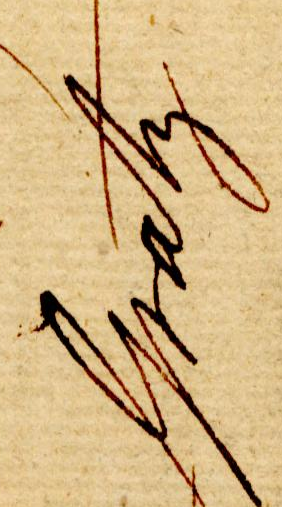Gratz
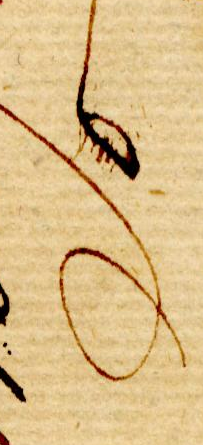To
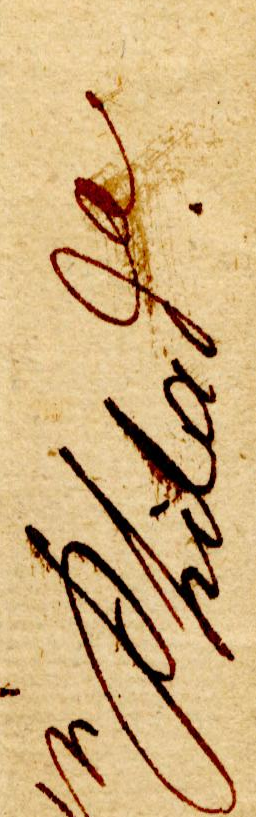Philad^a
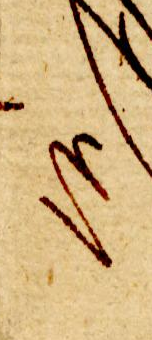In
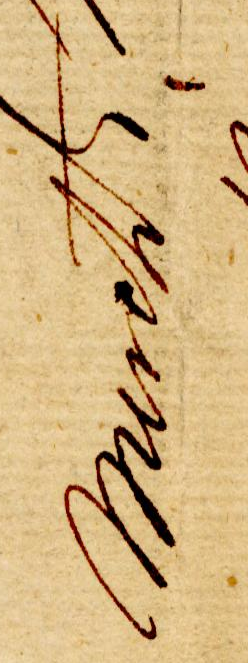Merch^ts
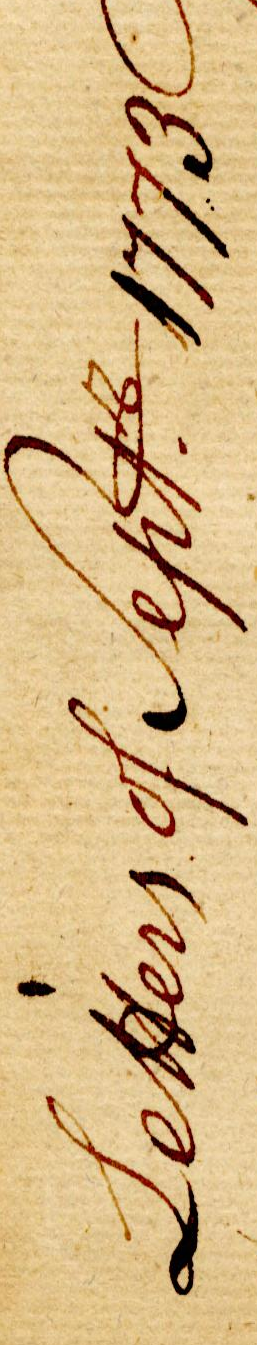Letters of Sept^r 1773 of
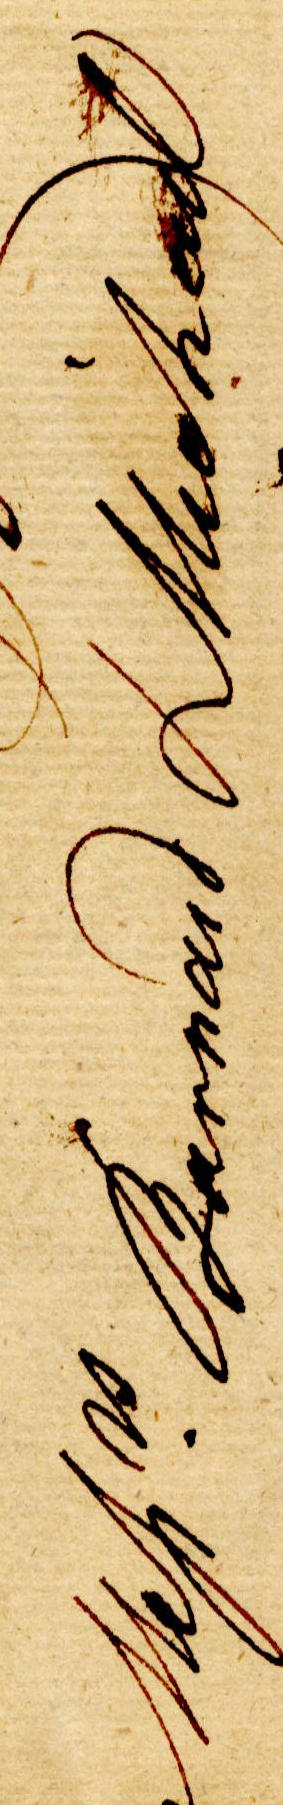Mess^rs Barnard & Michael
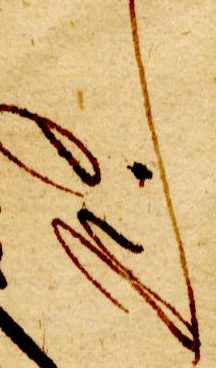p^d
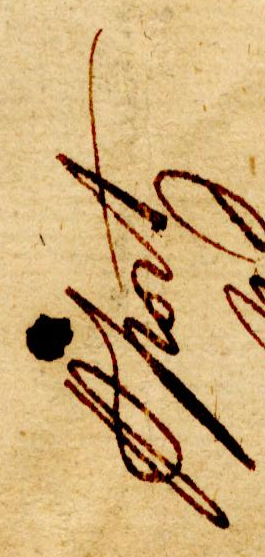per post
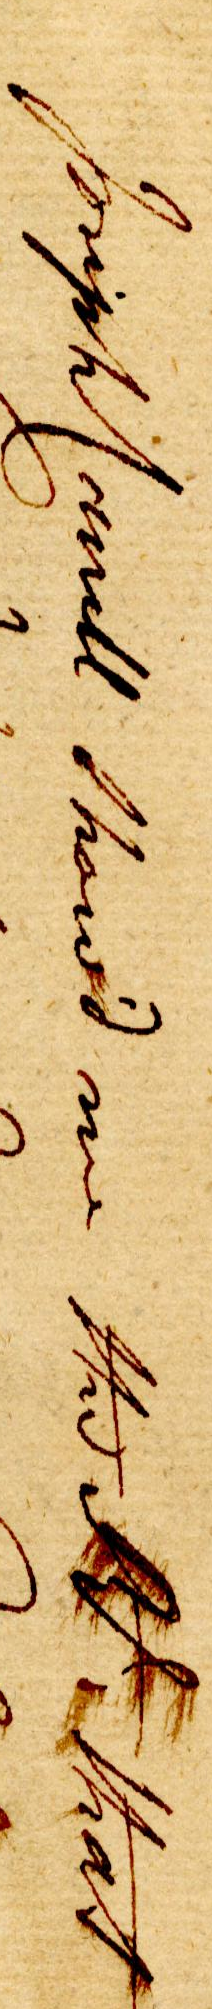Joseph Camell show'd me the Pt^s that
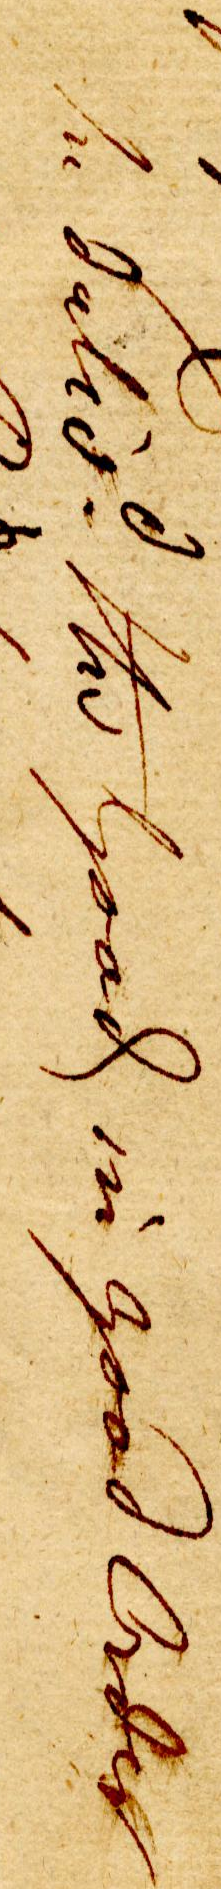In deliv^d the Goads in good order
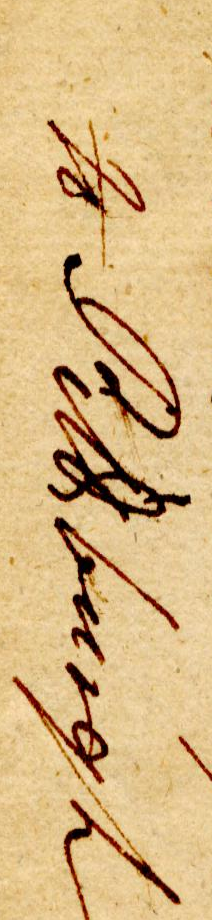to Pitdsburgh
